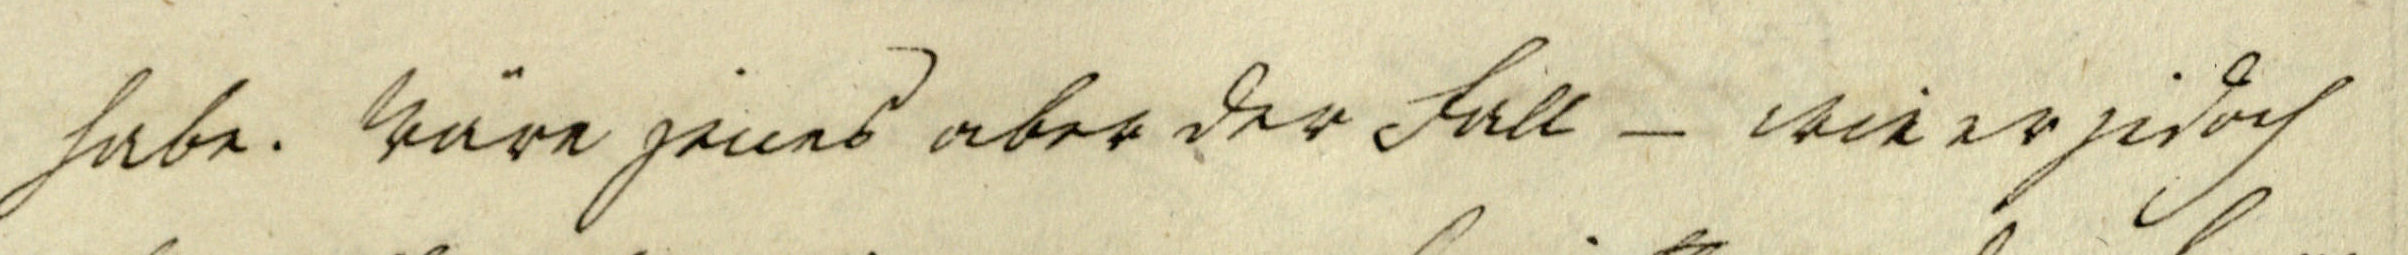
habe. Wäre jenes aber der Fall wie er jedoch
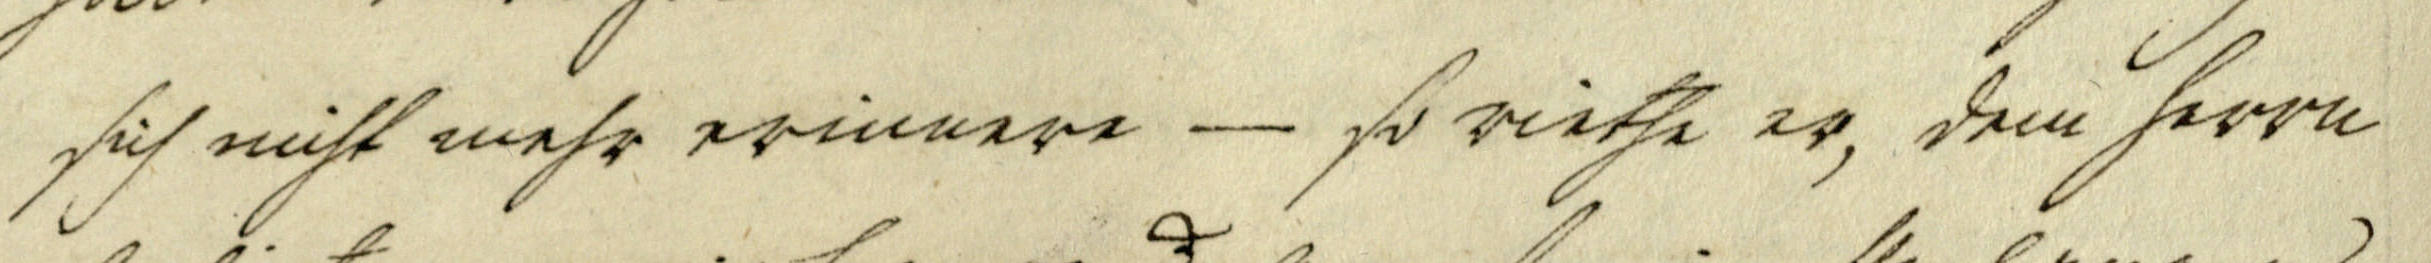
sich nicht mehr erinnere so riethe er, dem Herrn
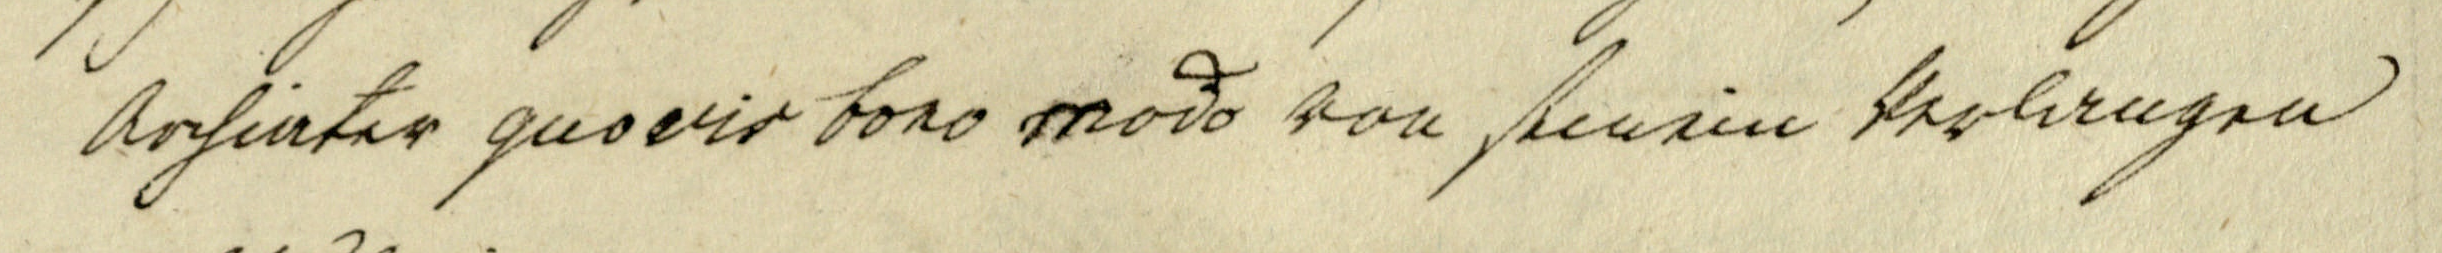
Archiater quovis bono modo von seinem Verlangen
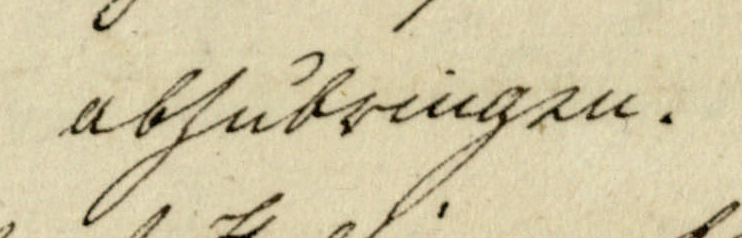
abzubringen.
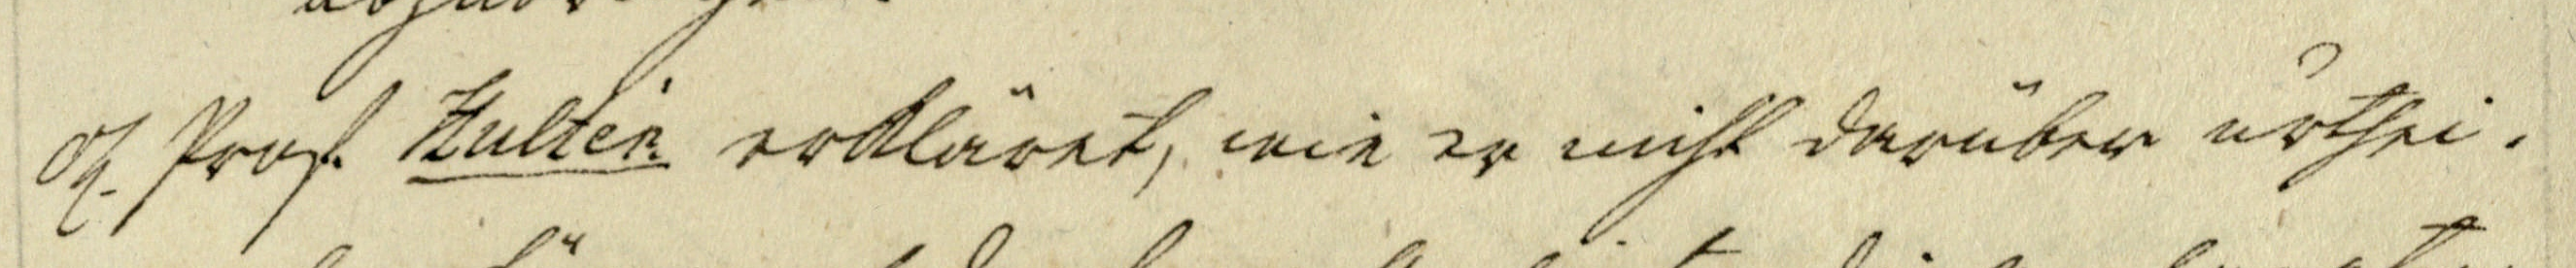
dh. Prof. Hultén erkläret, wie er nicht darüber urthei¬
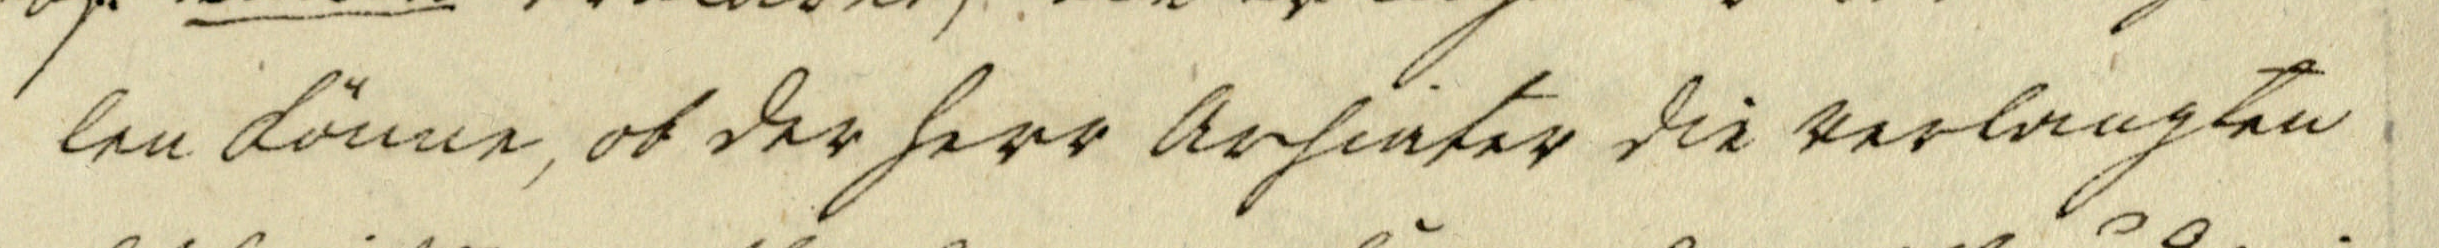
len könne, ob der Herr Archiater die verlangten
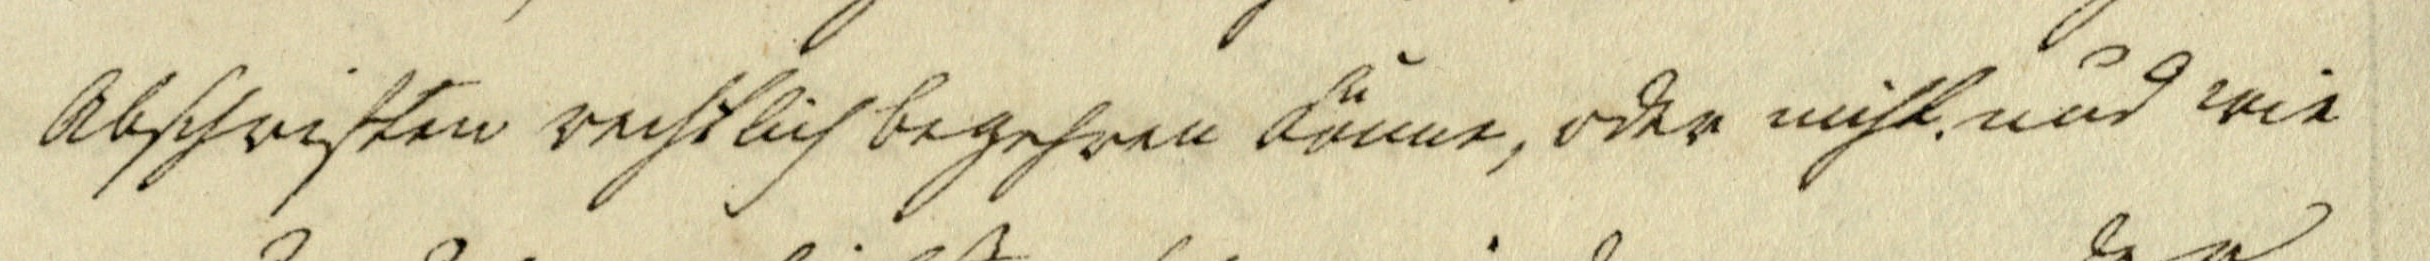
Abschriften rechtlich begehren könne, oder nicht und wie
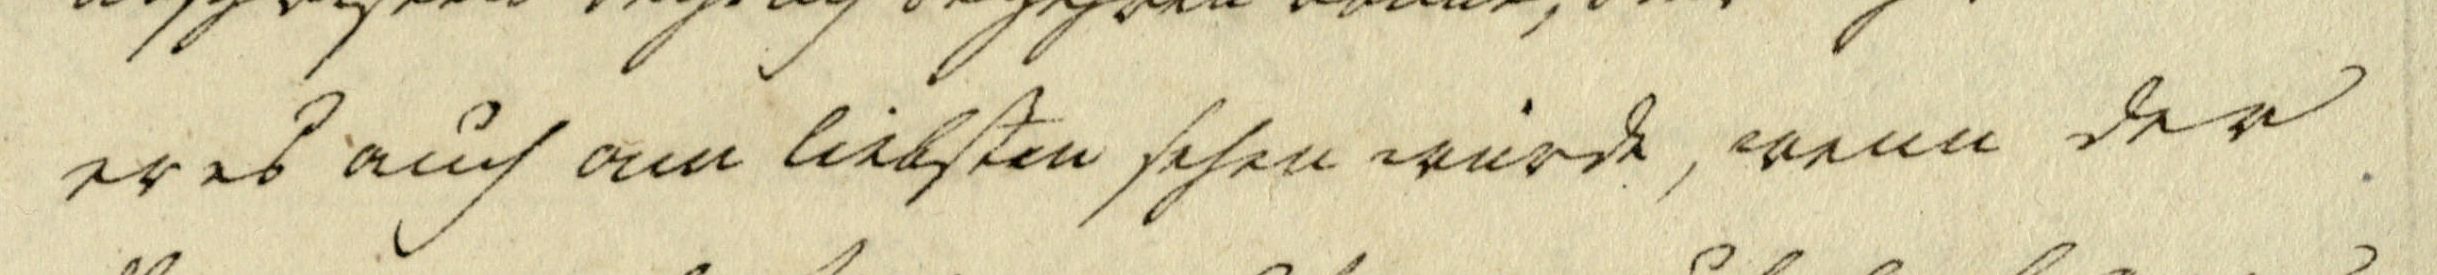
er es auch am liebsten sehen würde, wenn der
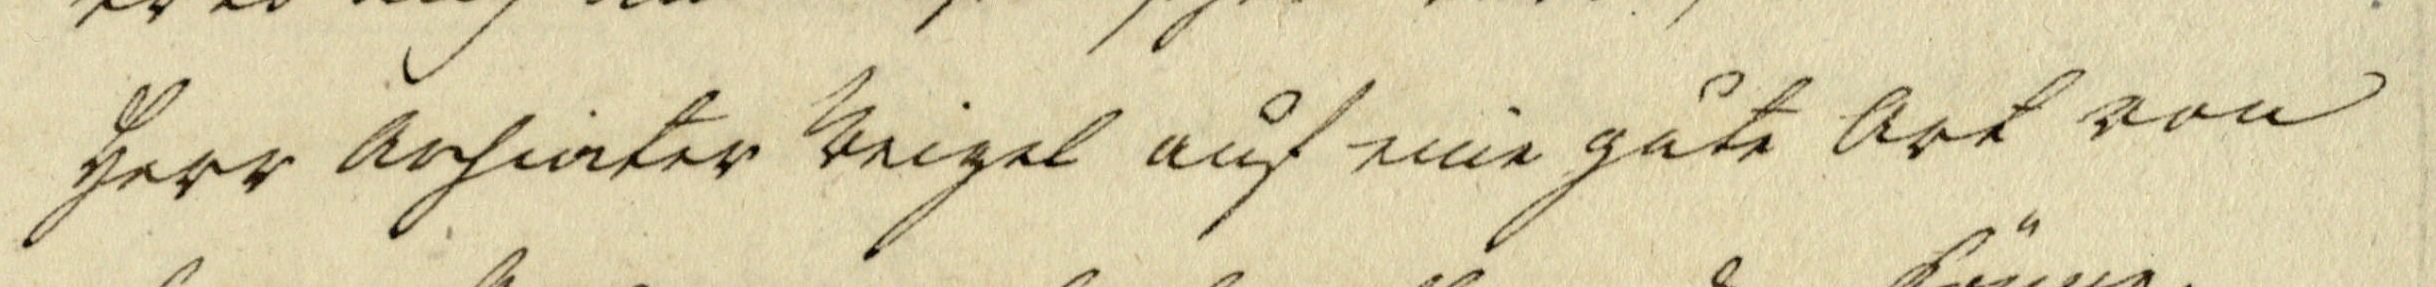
Herr Archiater Weigel auf eine gute Art von
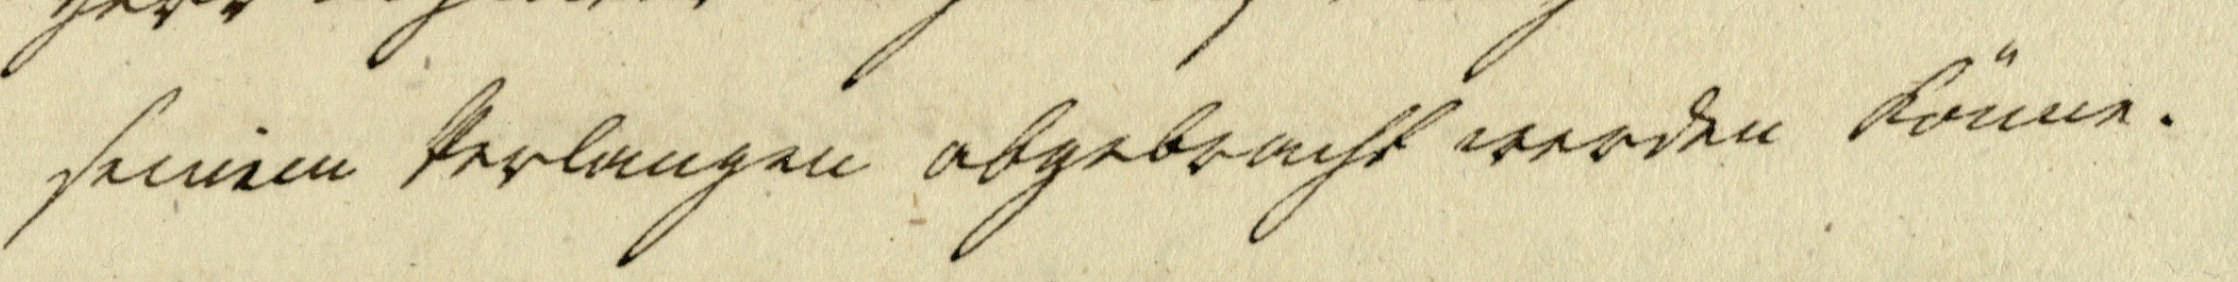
seinem Verlangen abgebracht werden könne.
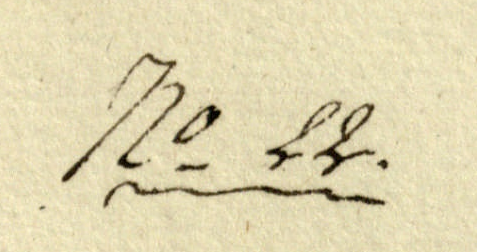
No 22.
